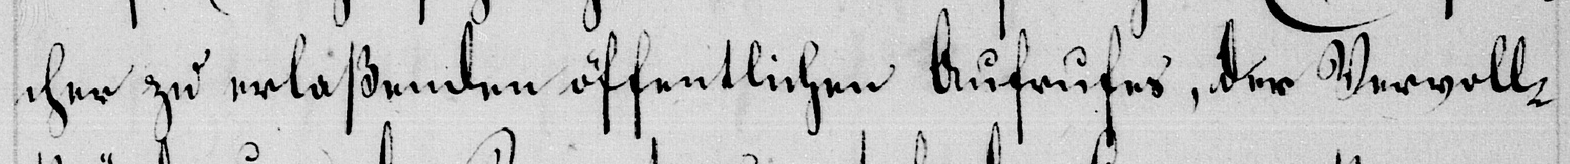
cher zu erlaßenden öffentlichen Aufrufes, der Vervoll¬
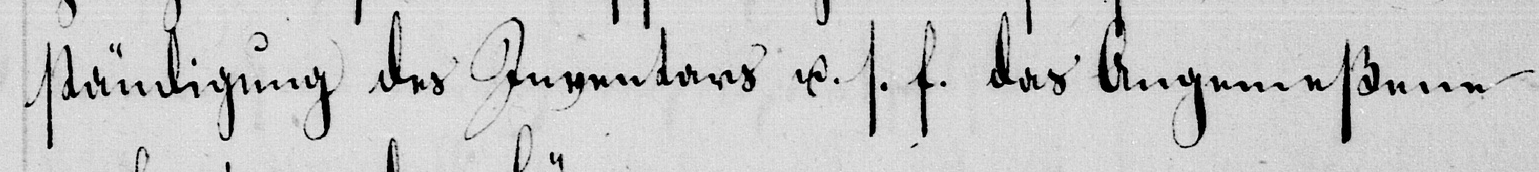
ständigung des Inventars u. s. f. das Angemeßene
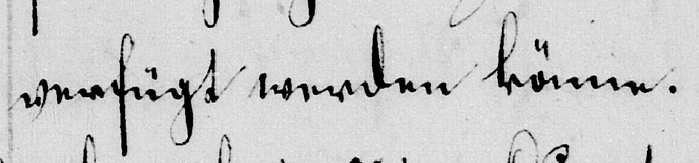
verfügt werden könne.
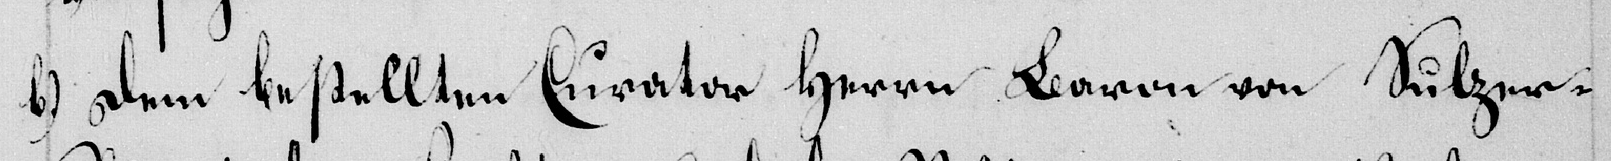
b.) Dem bestellten Curator Herrn Baron von Sulze¬
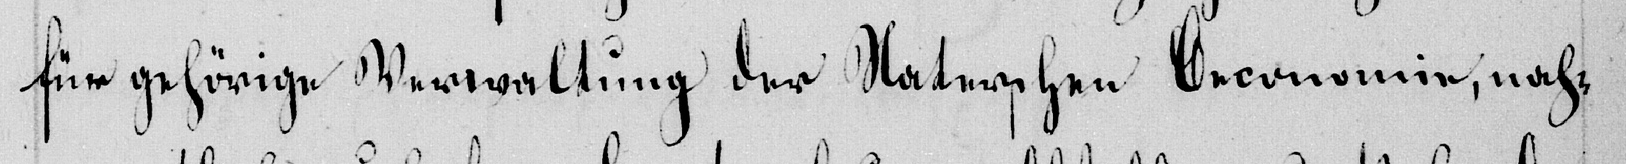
für gehörige Verwaltung der Naterschen Oeconomie, nah¬
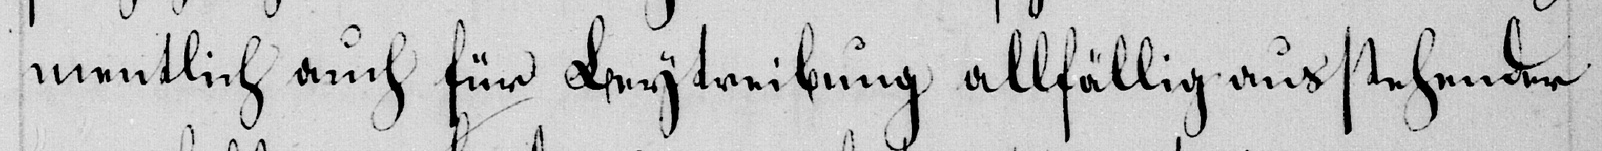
mentlich auch für Beytreibung allfällig ausstehender
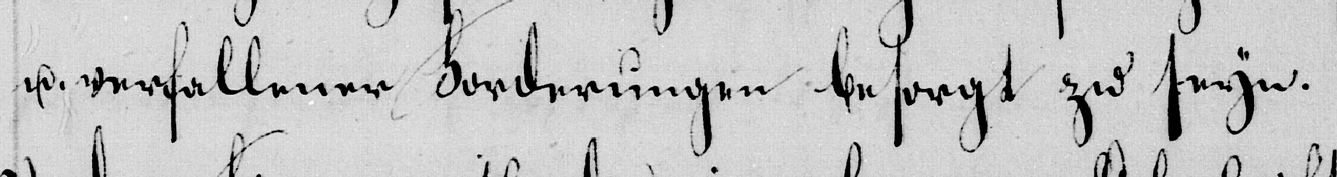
u. verfallener Forderungen besorgt zu seyn.
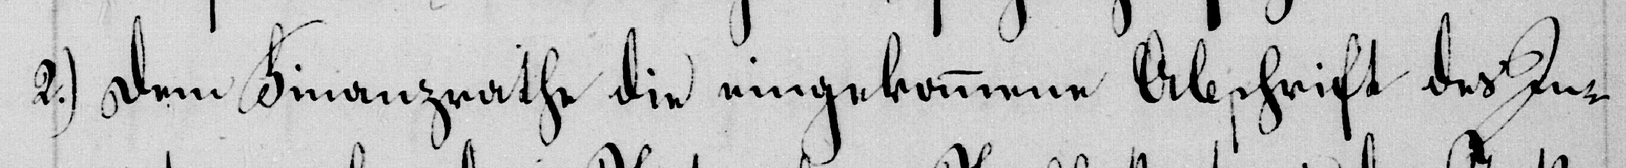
2.) Dem Finanzrathe die eingekommene Abschrift des In¬
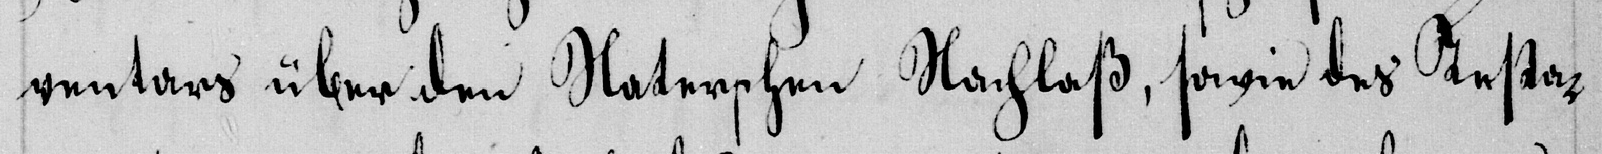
ventars über den Naterschen Nachlaß, sowie des Testa¬
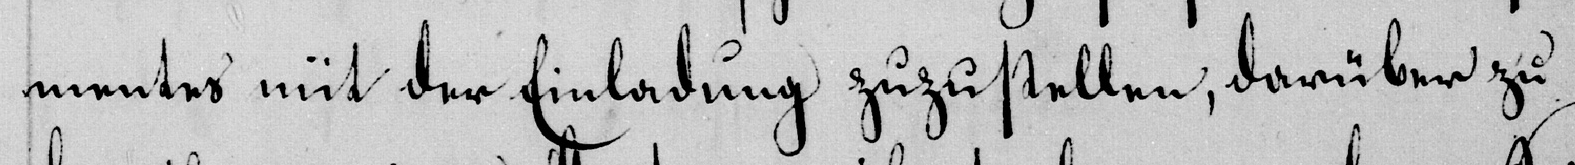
mentes mit der Einladung zuzustellen, darüber zu
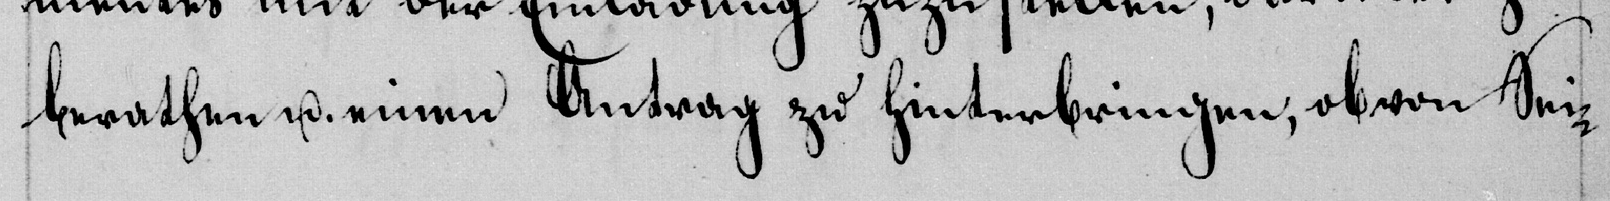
berathen u. einen Antrag zu hinterbringen, ob von Sei-
